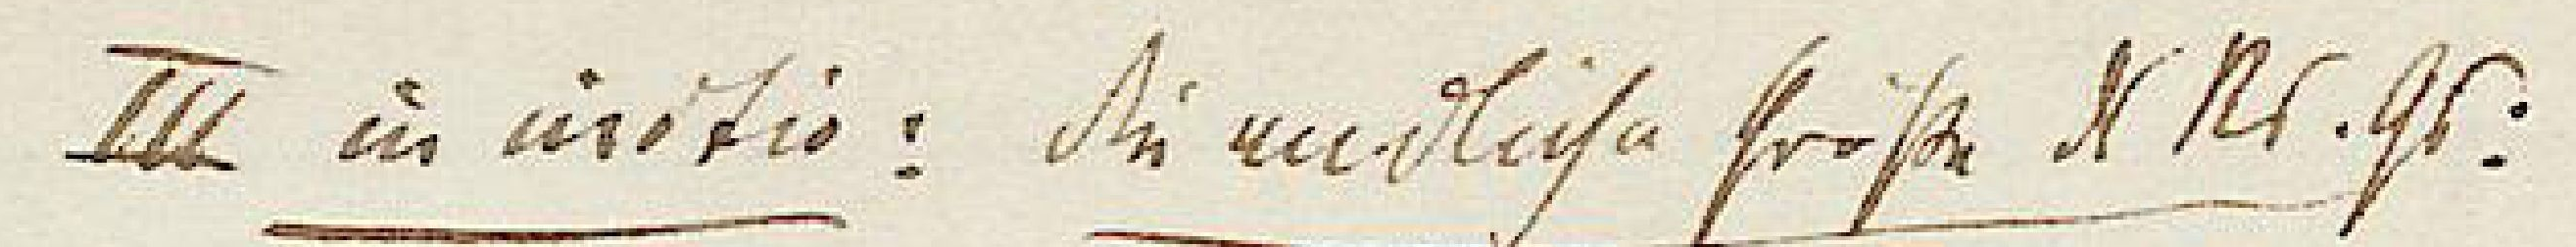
III in initio: die endliche Größe ds Rs Gs:
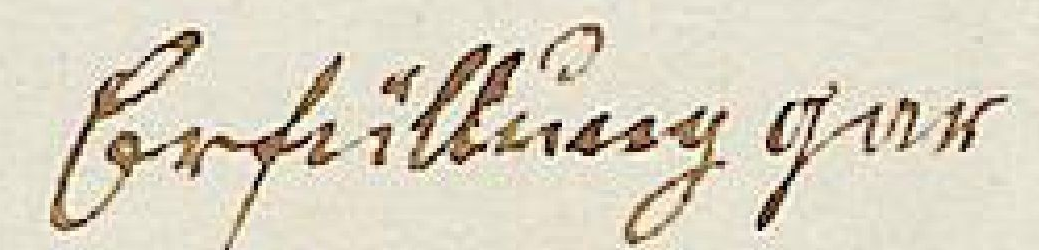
Erfüllung gar
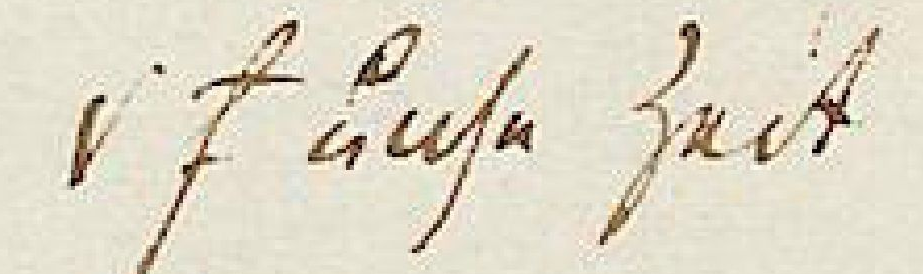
V f unsr Zeit
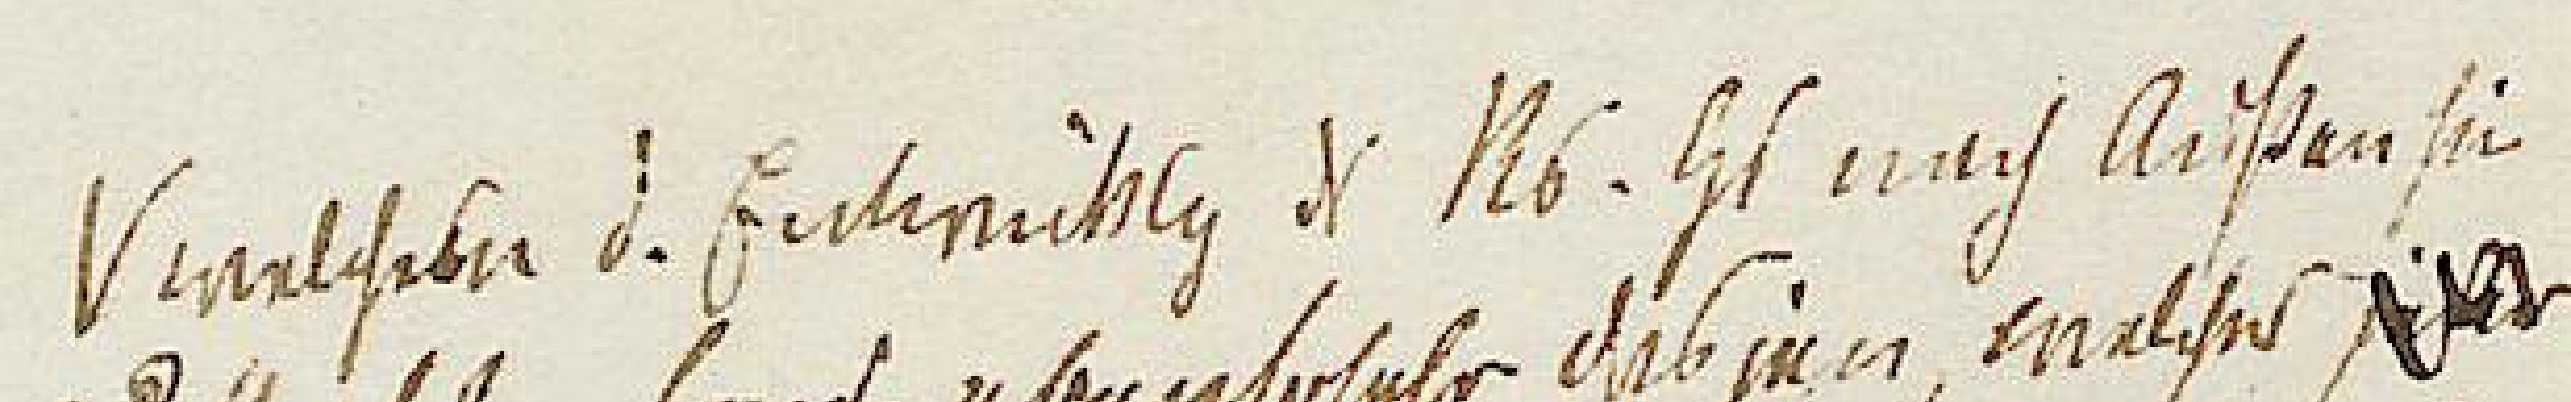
V welchren d. Entwicklg ds Rs. Gs nach Außen sie
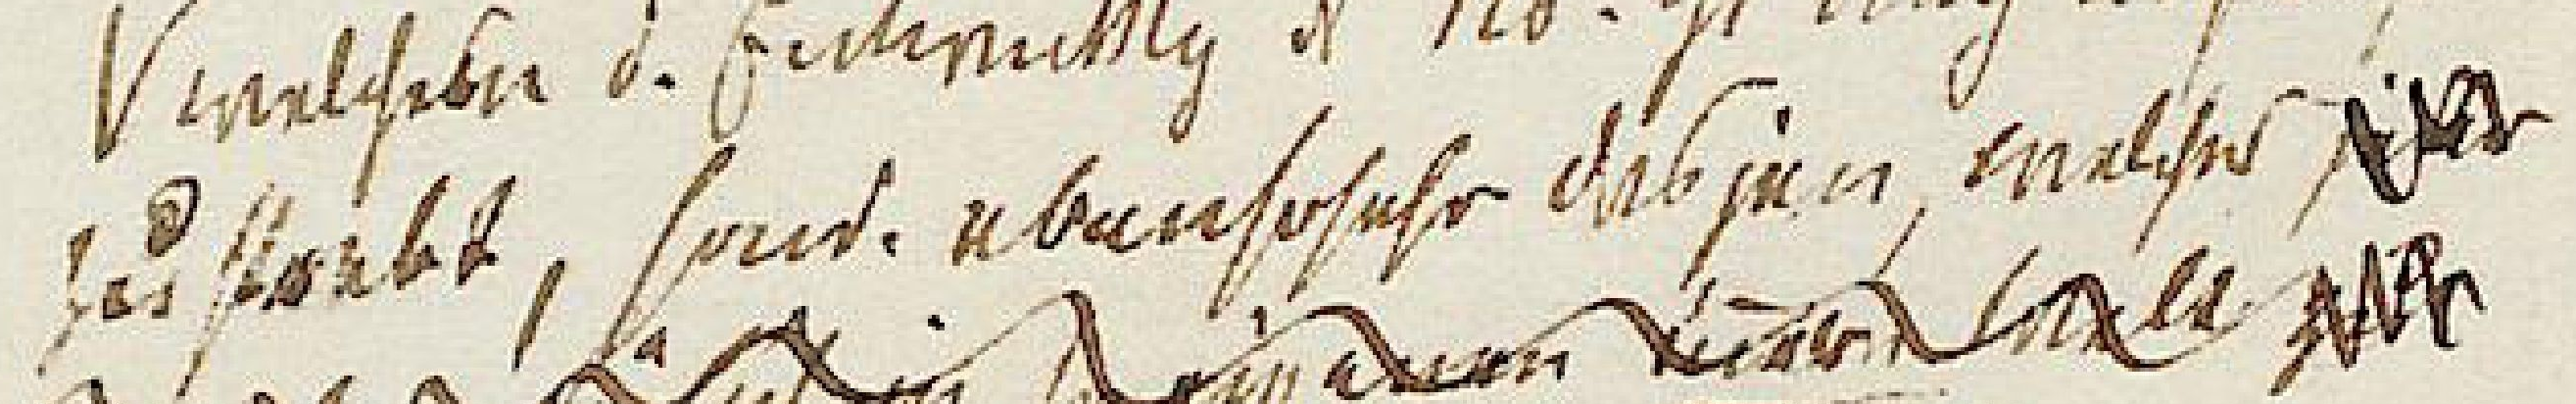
zustrebt, sond. ebensosehr desjen, welches ja der
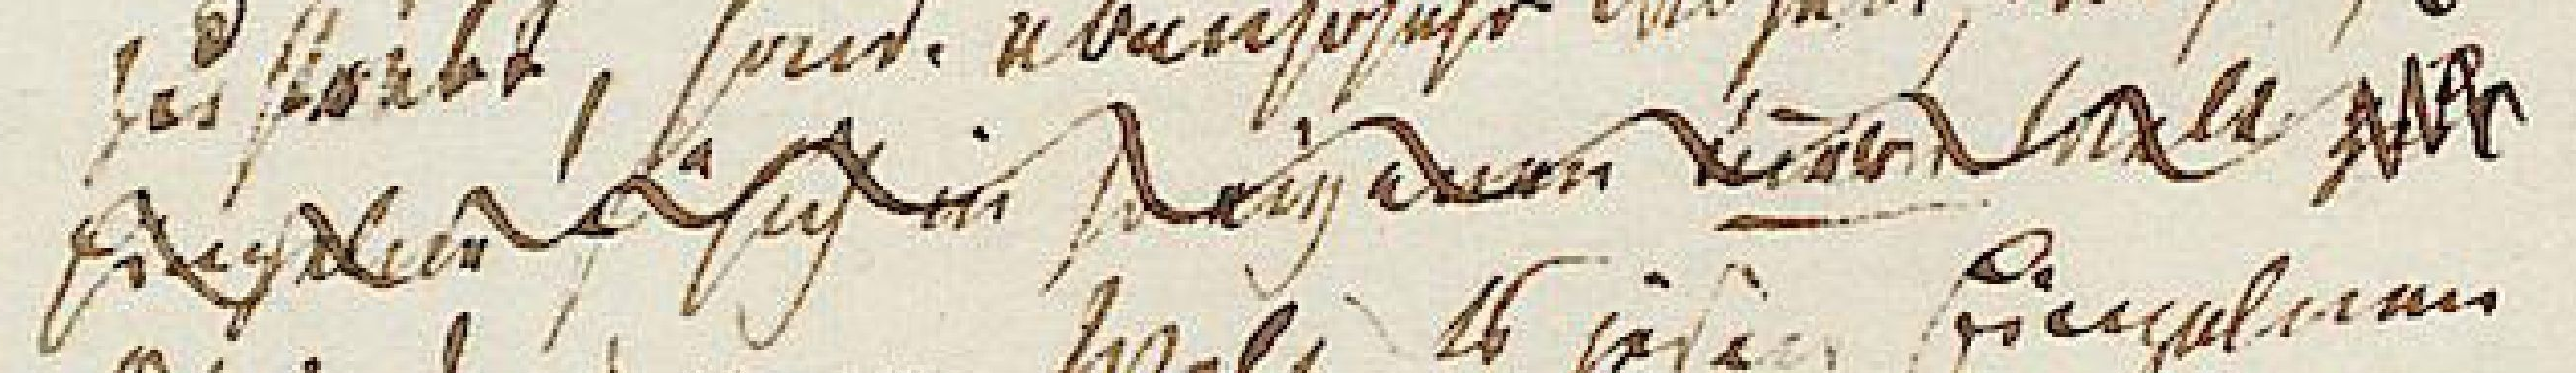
Einzelne fü sich in sm eigenen tun soll zu
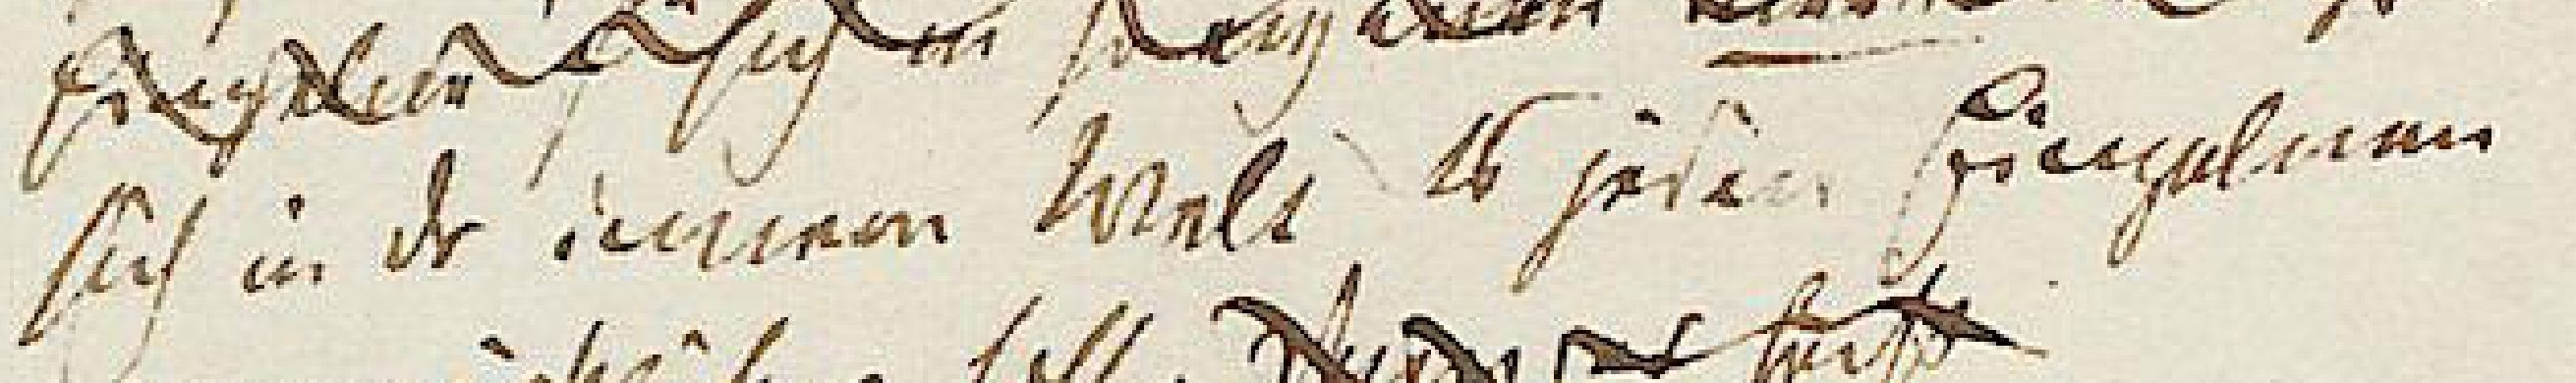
sich in dr inneren Welt 1s jeden Einzelnen
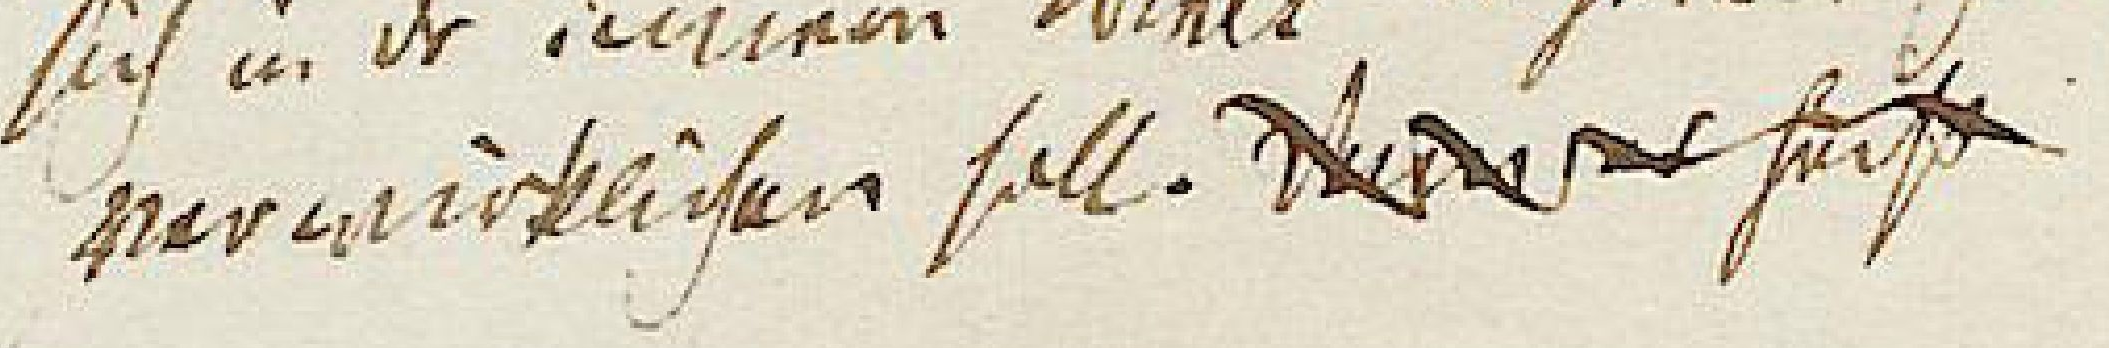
verwirklichen soll. Denn es heißt
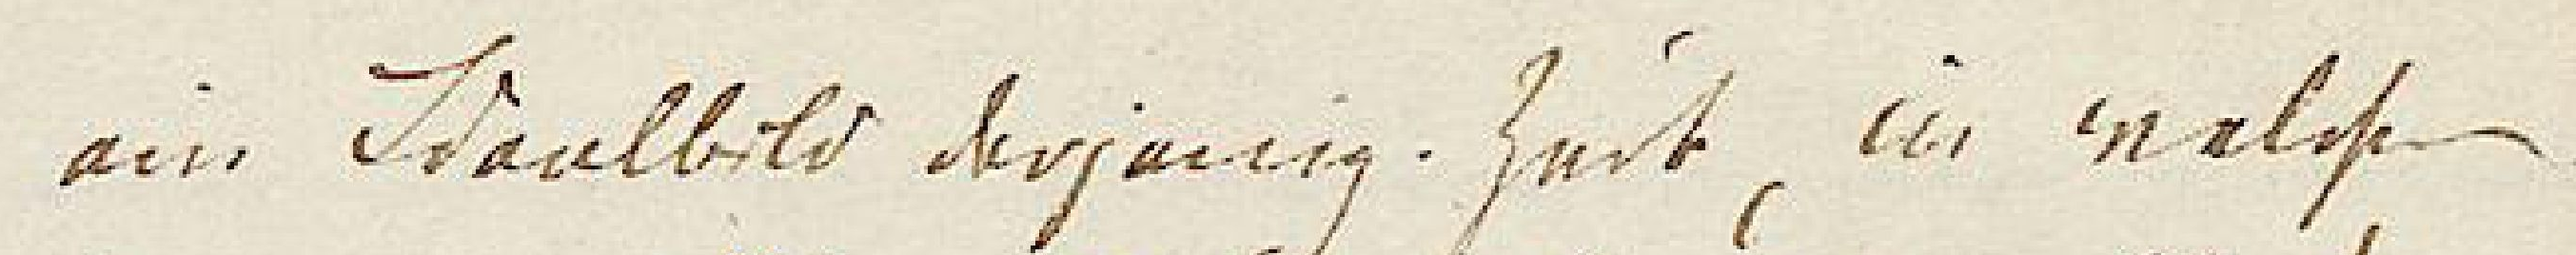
ein Idealbild derjenig. Zeit, in welcher
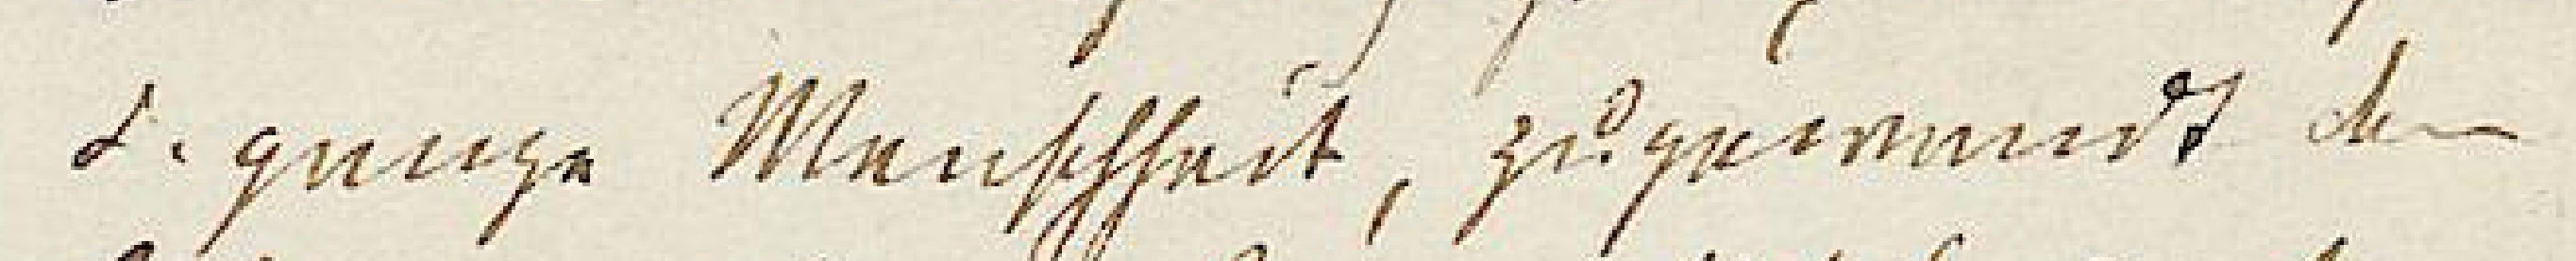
d. ganze Menschheit, zugewandt denn
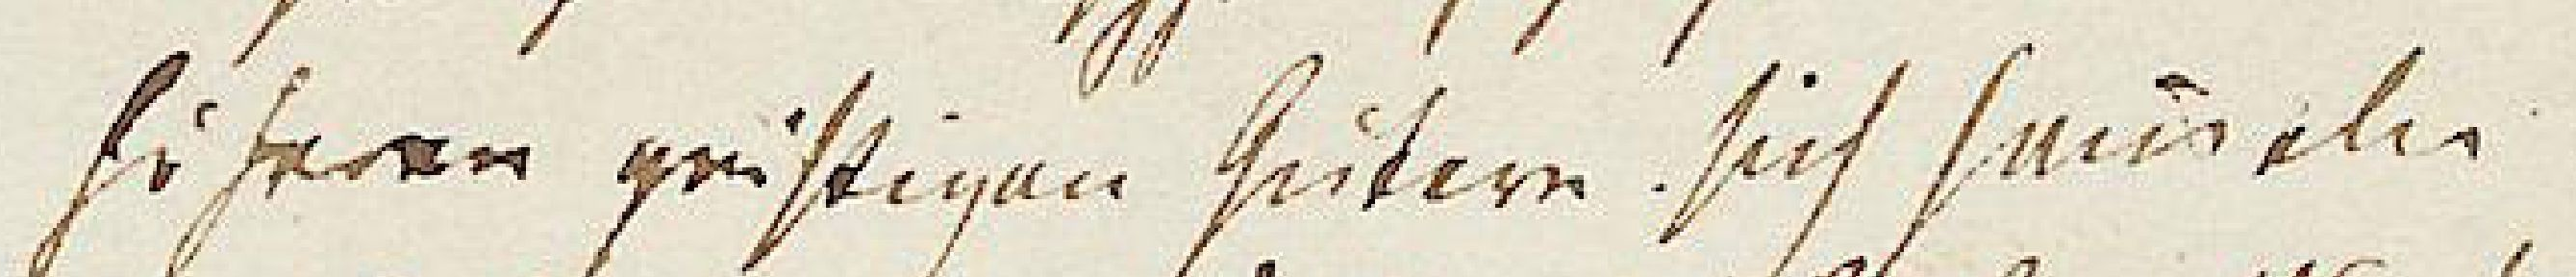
höheren geistigen Gütern sich sameln
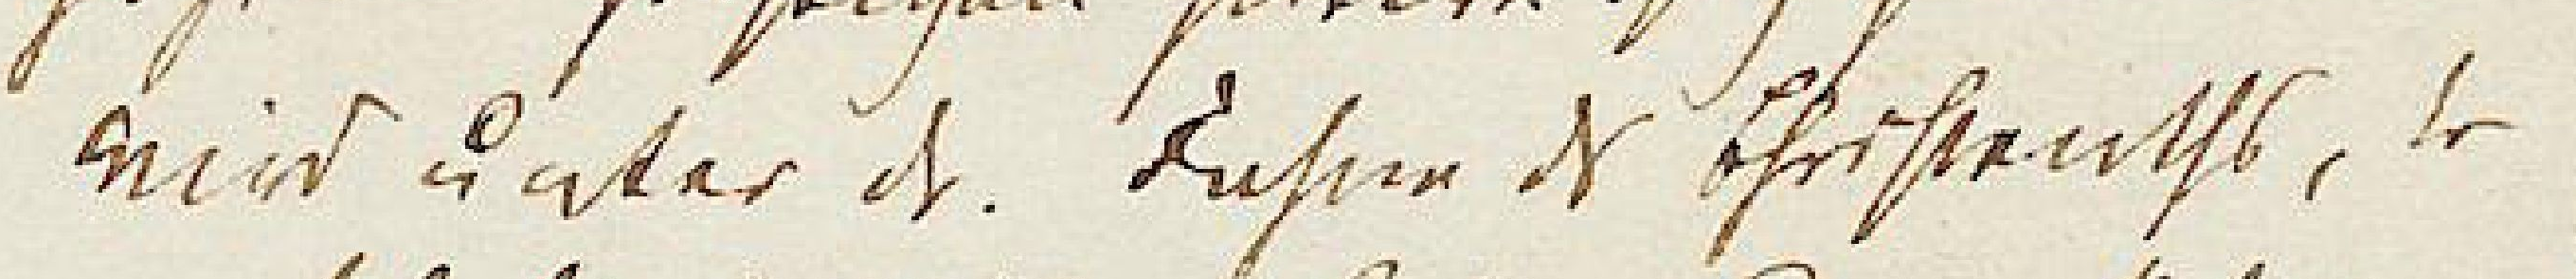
wird unter dr. Fahne ds Christenths, dr.
